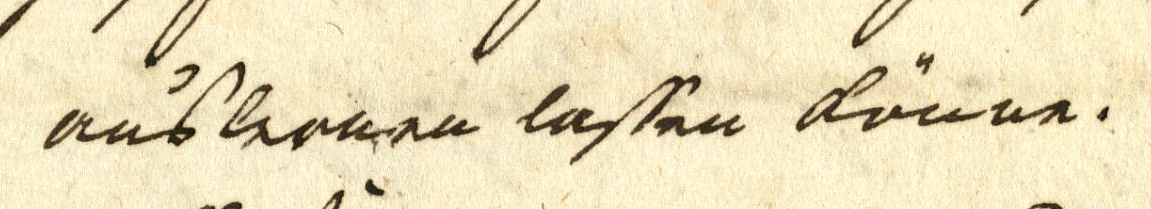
auslernen lassen könne.
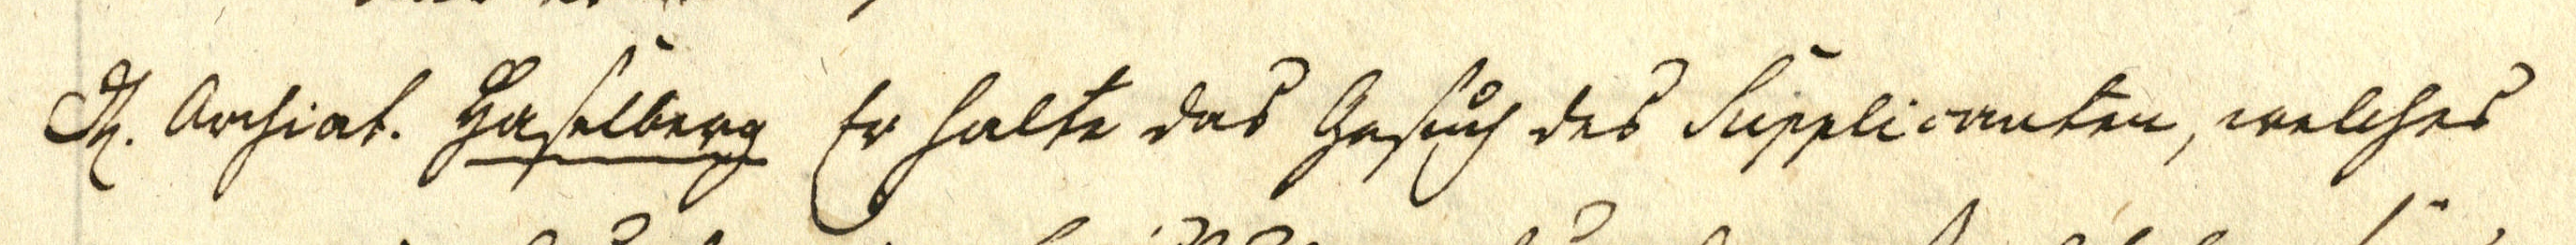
dh. Archiat. Haselberg. Er halte das Gesuch des Supplicanten, welches
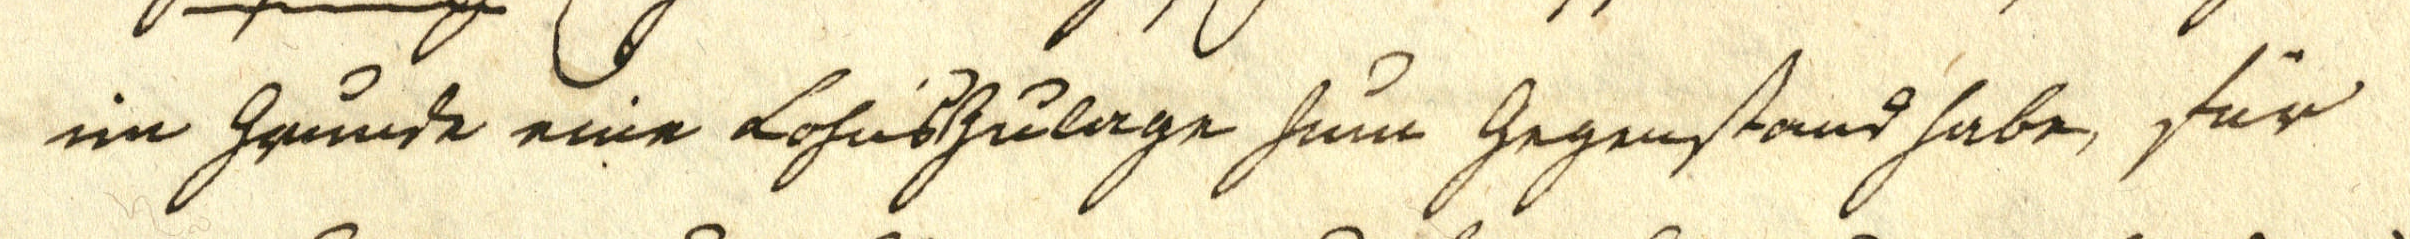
im Grunde eine Lohnszulage zum Gegenstand habe, für
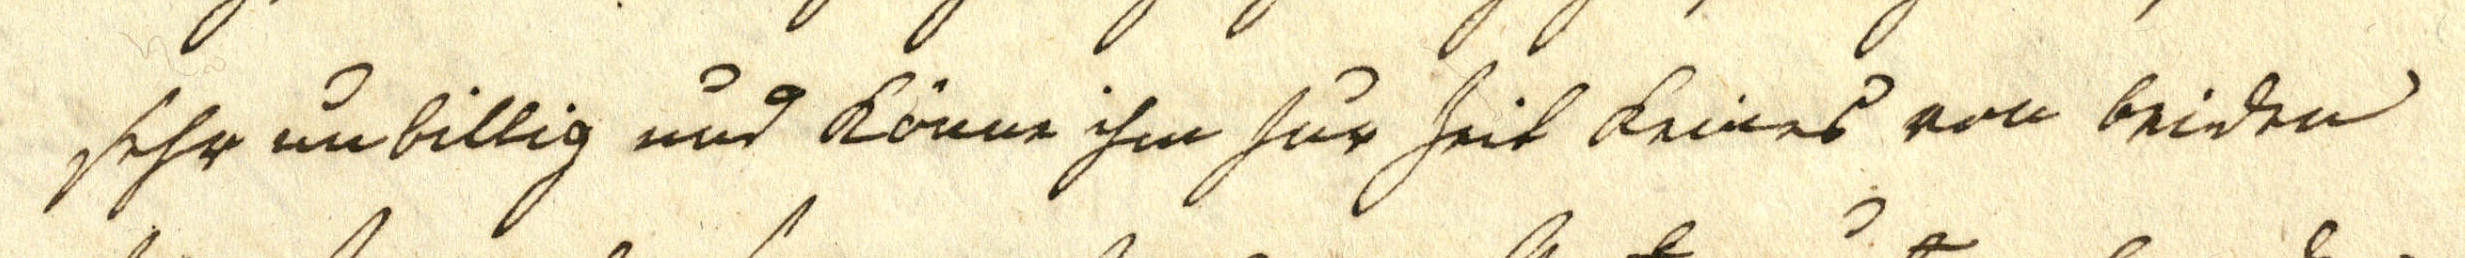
sehr unbillig und könne ihm zur Zeit keines von beiden
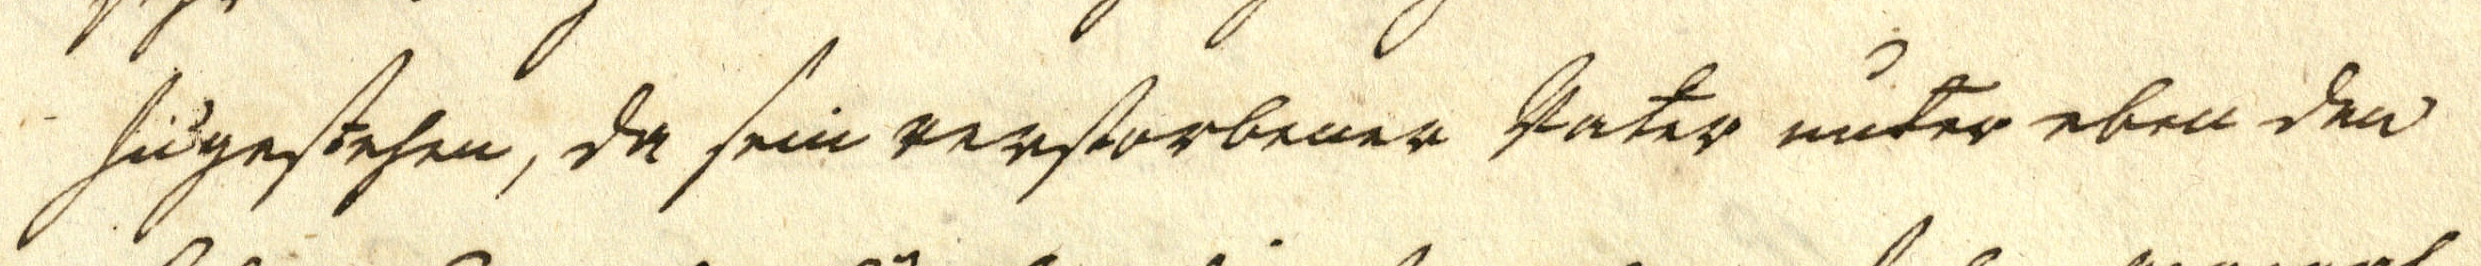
zugestehen, da sein verstorbener Vater unter eben den
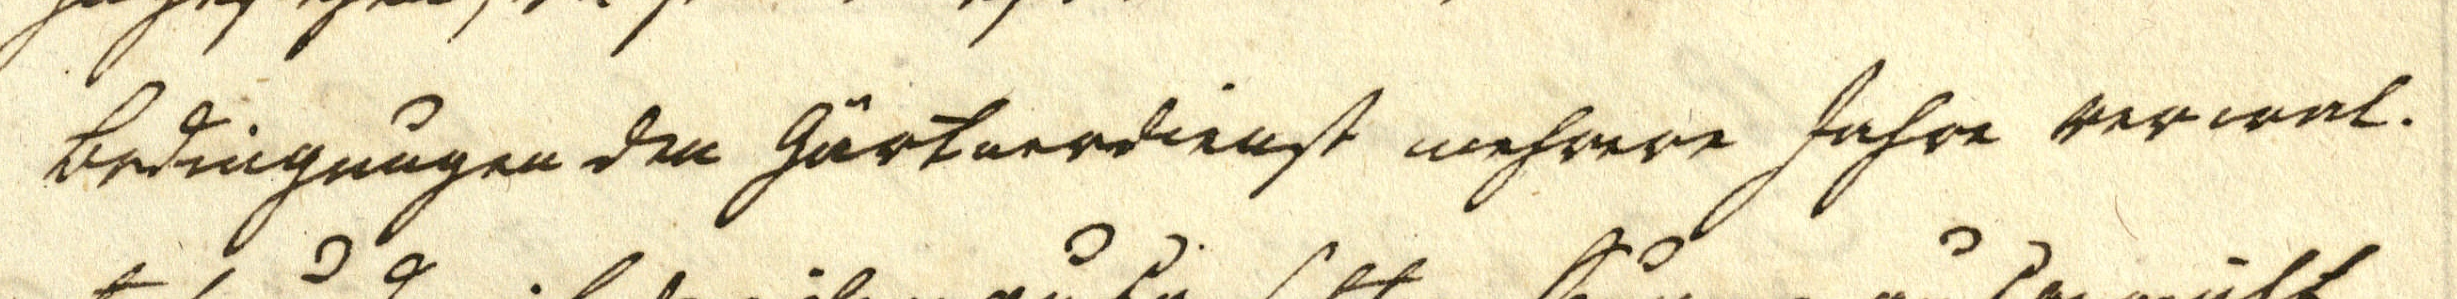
Bedingungen den Gärtnerdienst mehrere Jahre verwal¬
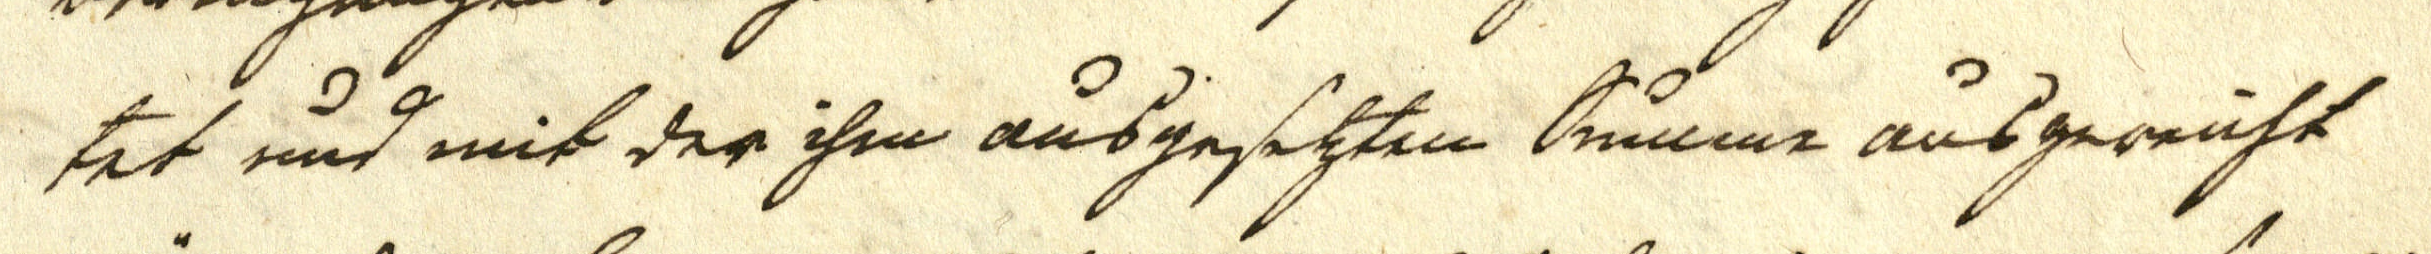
tet und mit der ihm ausgesetzten Summe ausgereicht
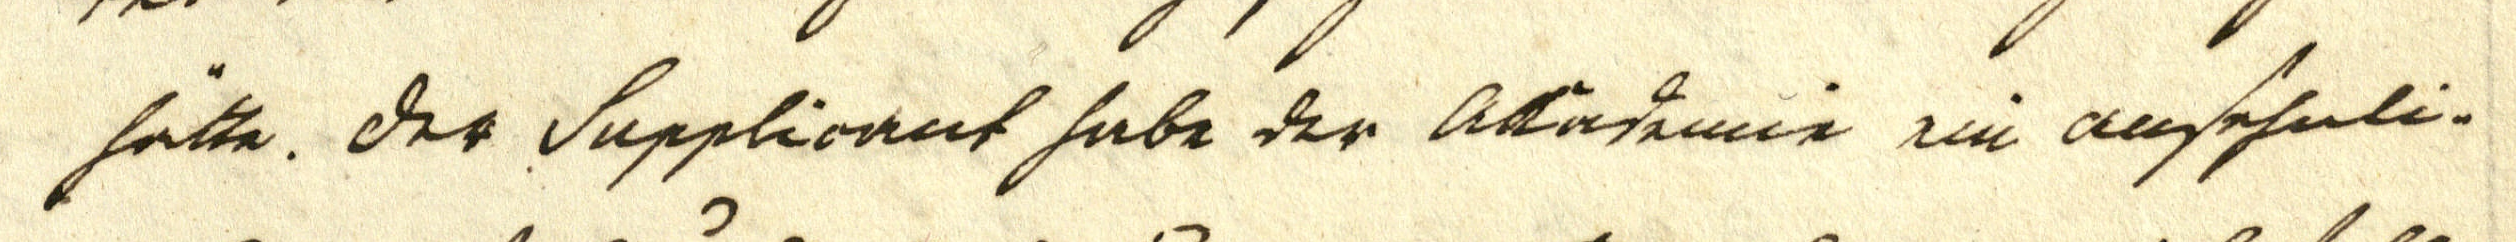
hätte. Der Supplicant habe der Akademie ein ansehnli¬
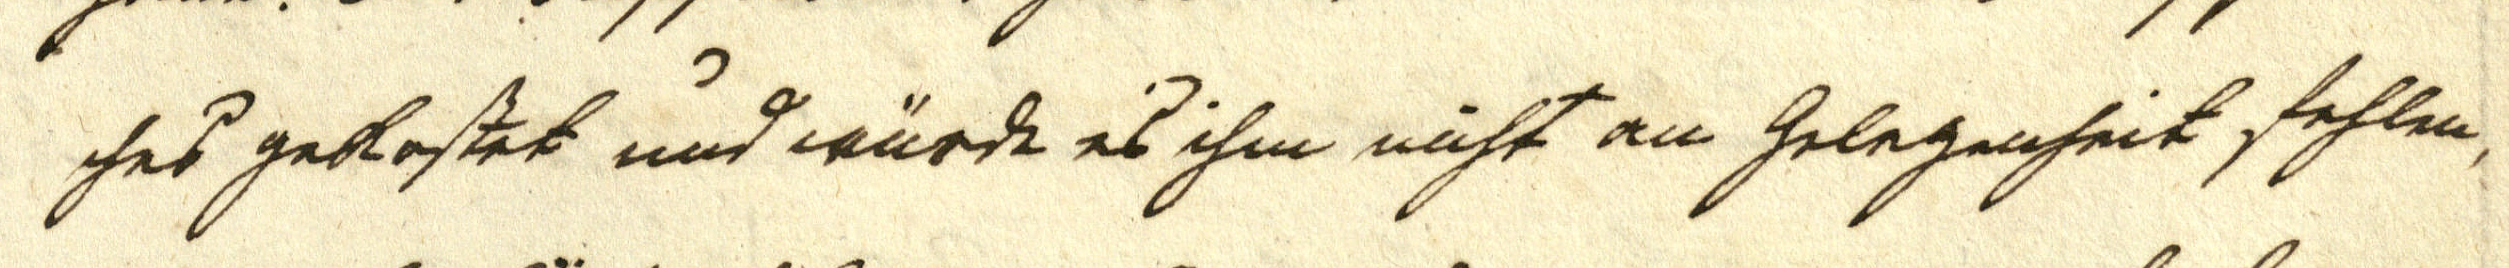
ches gekostet und würde es ihm nicht an Gelegenheit fehlen,
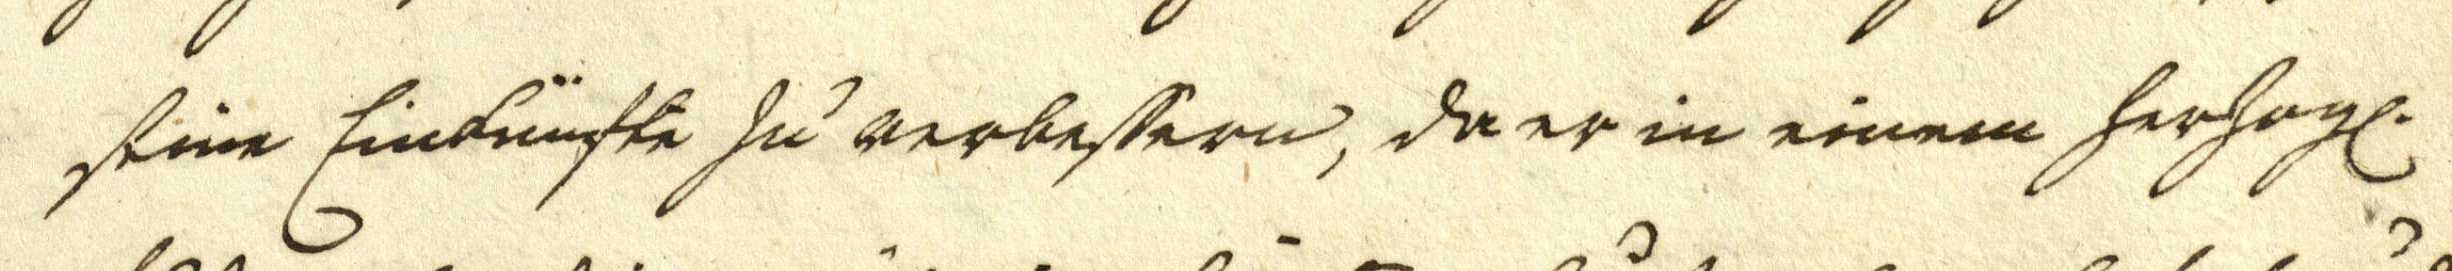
seine Einkünfte zu verbessern, da er in einem Herzogl.
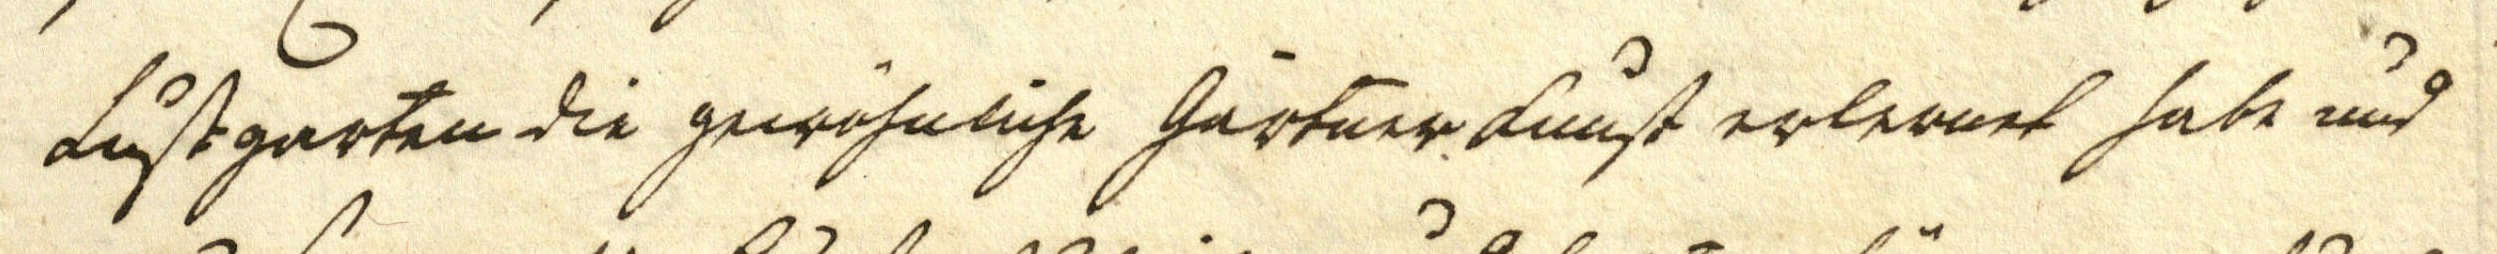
Lustgarten die gewöhnliche Gärtner kunst erlernet habe und
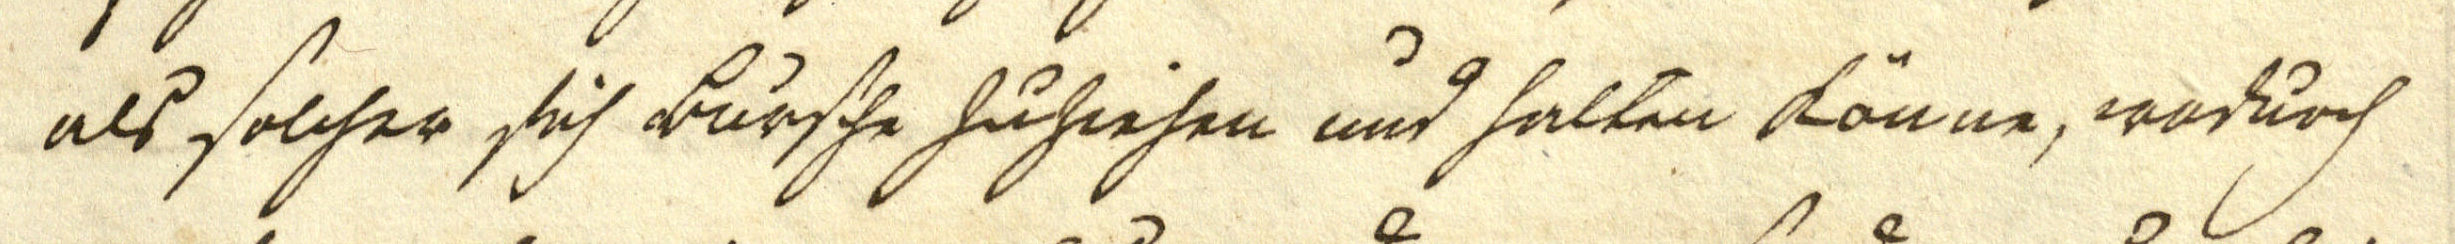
als solcher sich Bursche zuziehen und halten könne, wodurch
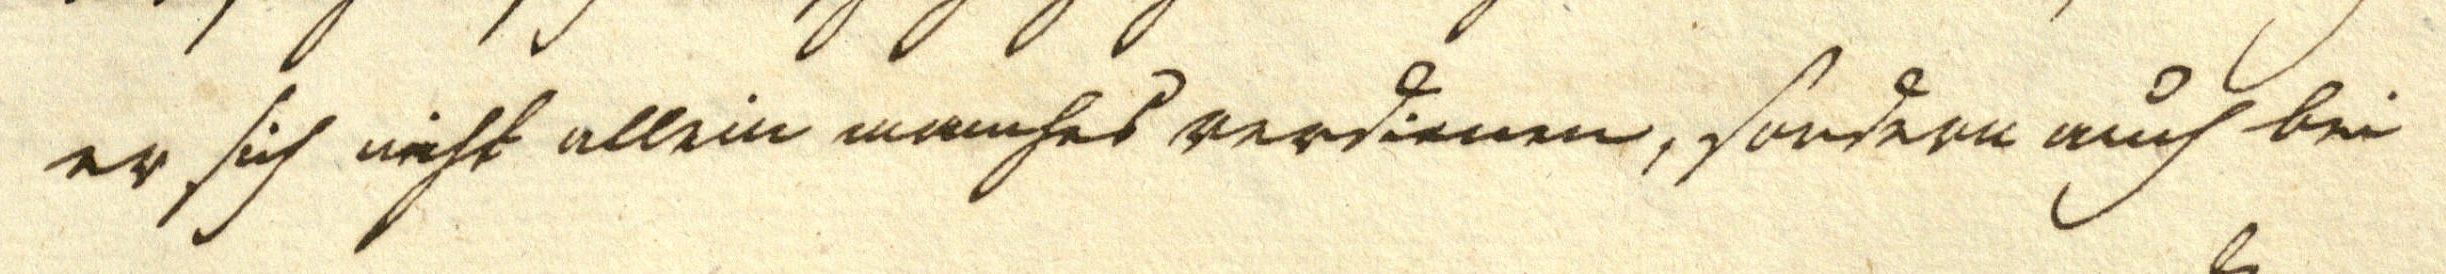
er sich nicht allein manches verdienen, sondern auch bei
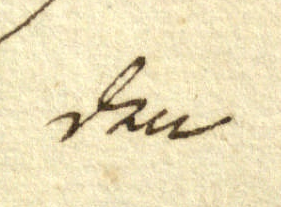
den
